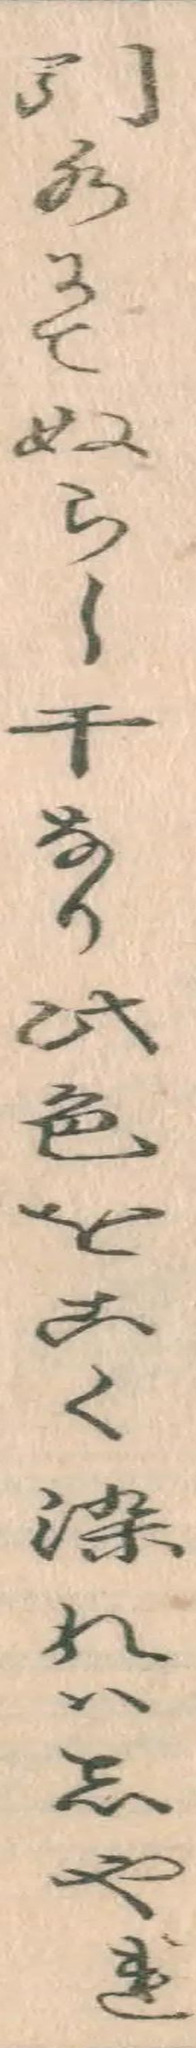引水にてぬらし干なり此色をこく染れはしやれ
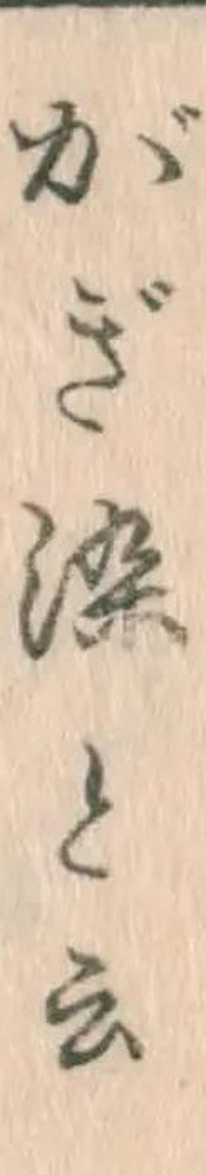がぎ染と云
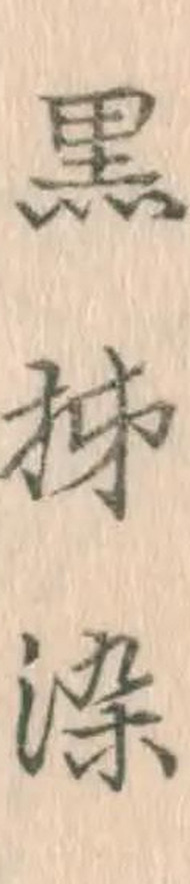黒柿染
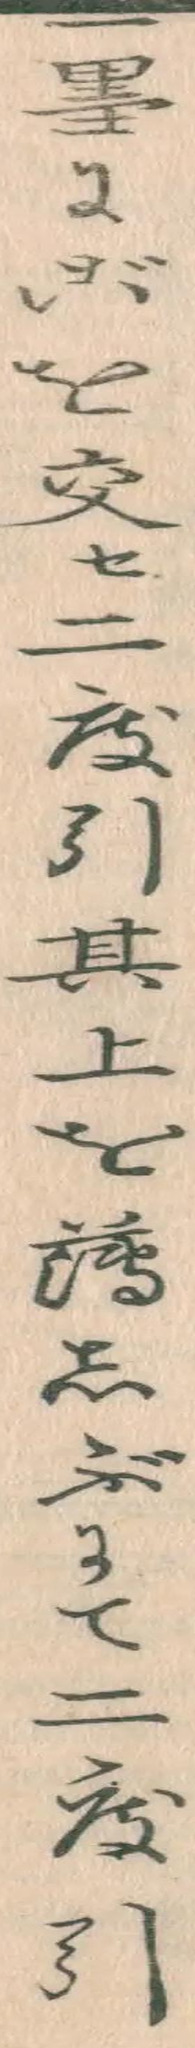一墨にごを交せ二度引其上を薄しぶにて二度引
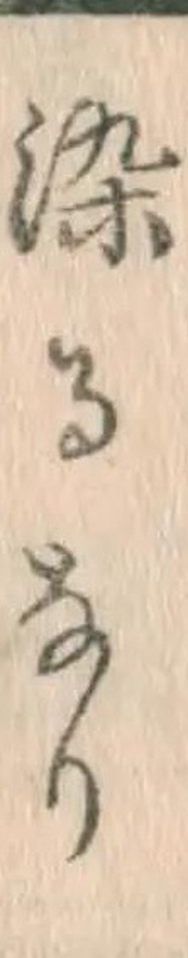染るなり
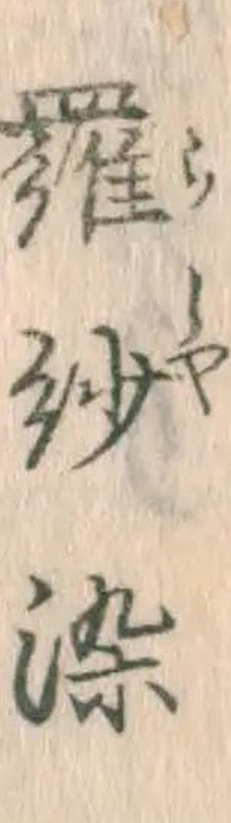羅紗染
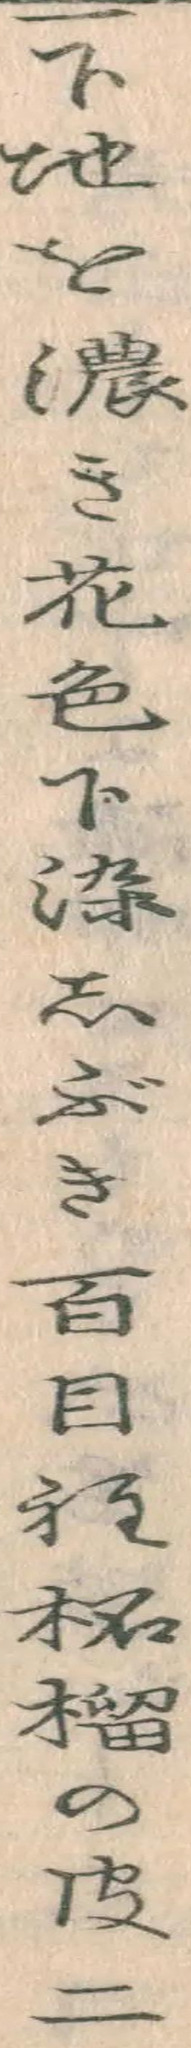一下地を濃き花色下染しぶき百目程柘榴の皮二
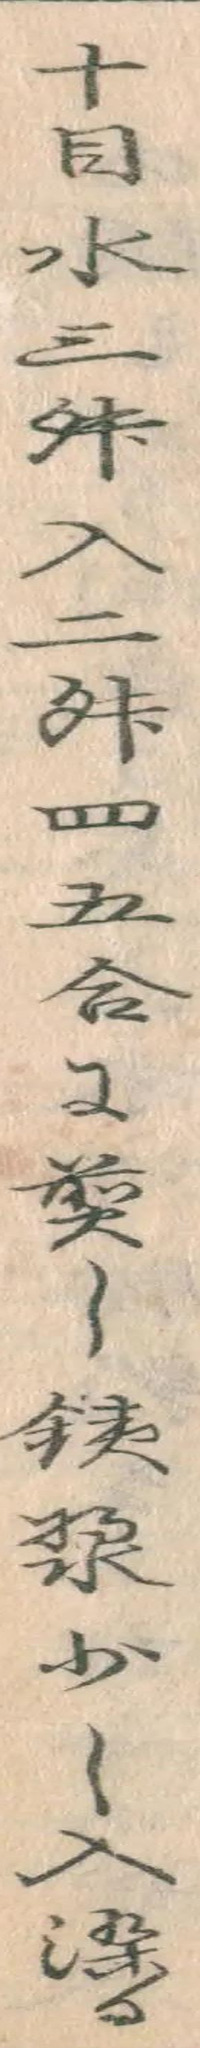十目水三升入二升四五合に煎し鉄漿少し入染る
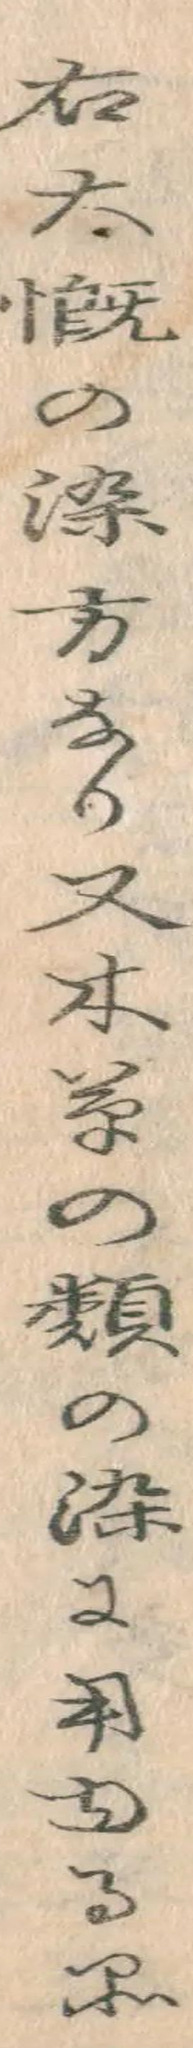右大概の染方なり又木草の類の染に用ゆる品
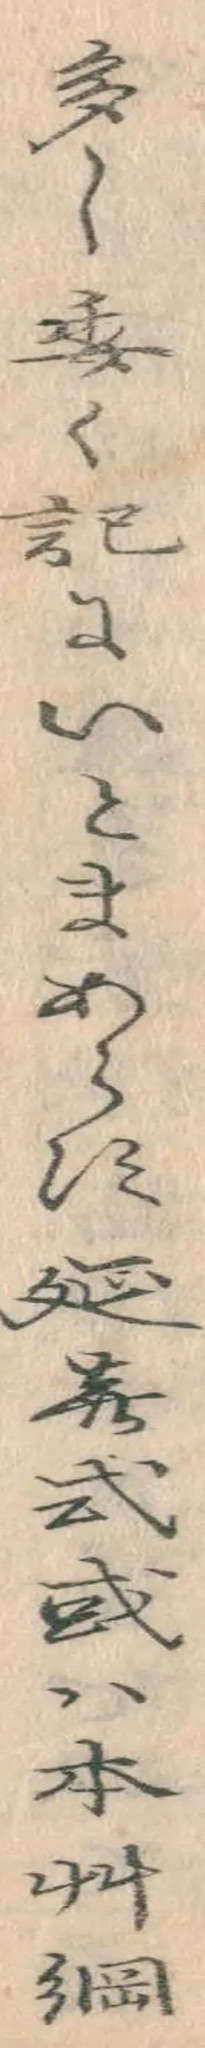多し委く記にいとまあらす延喜式或は本艸綱
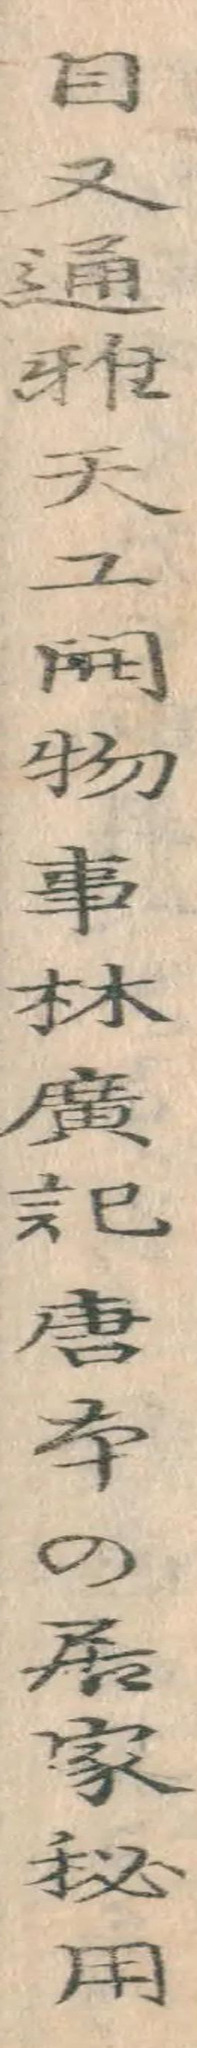目又通雅天工開物事林広記唐本の居家秘用

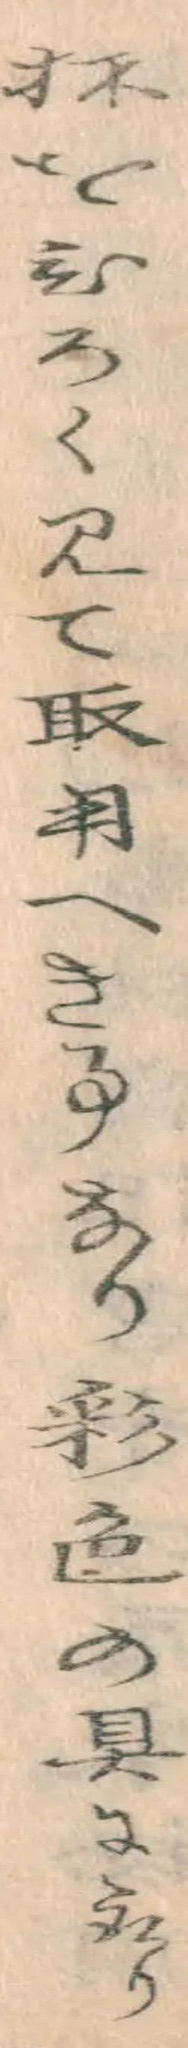抔をひろく見て取用へき事なり彩色の具に取り
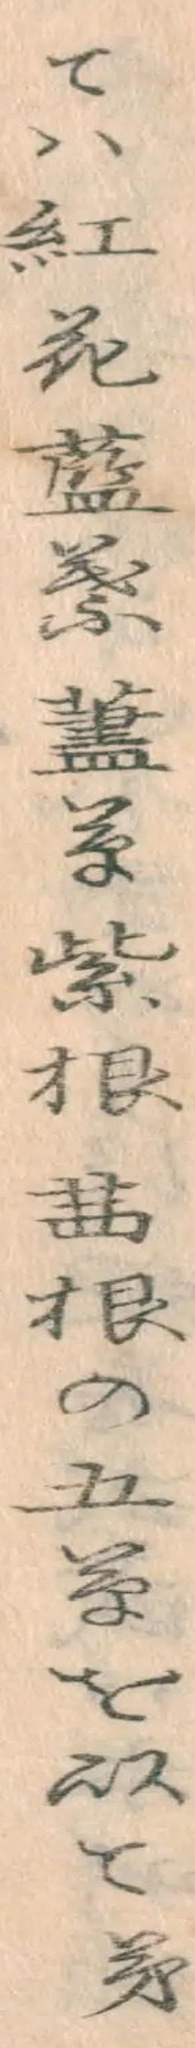ては紅花藍葉藎草紫根茜根の五草を以て第
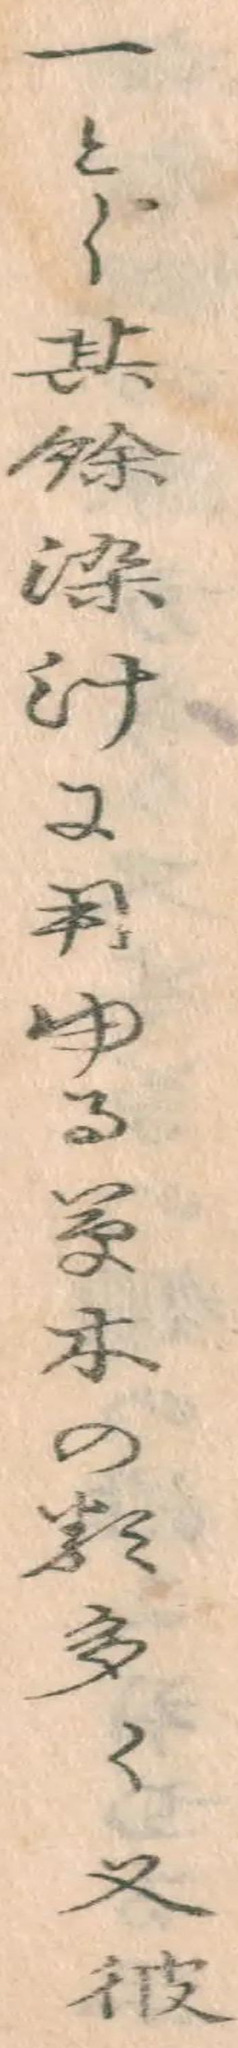一とし其余染汁に用ゆる草木の類多く又彼
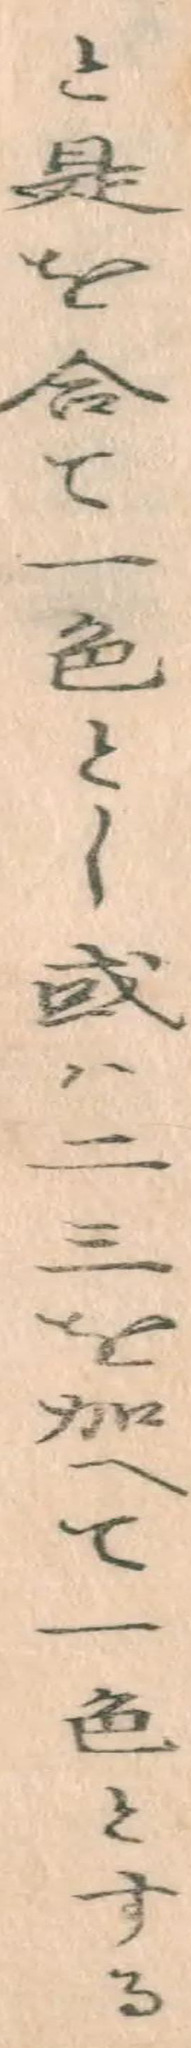と是を合て一色とし或は二三を加へて一色とする
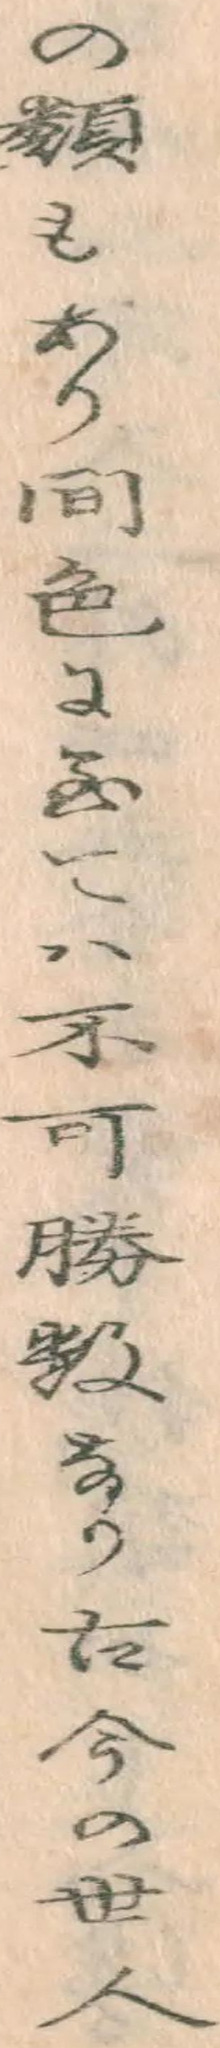の類もあり間色に至ては不可勝数なり古今の世人
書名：機織彙編 5巻. [1]
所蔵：国立国会図書館 National Diet Library, JAPAN
